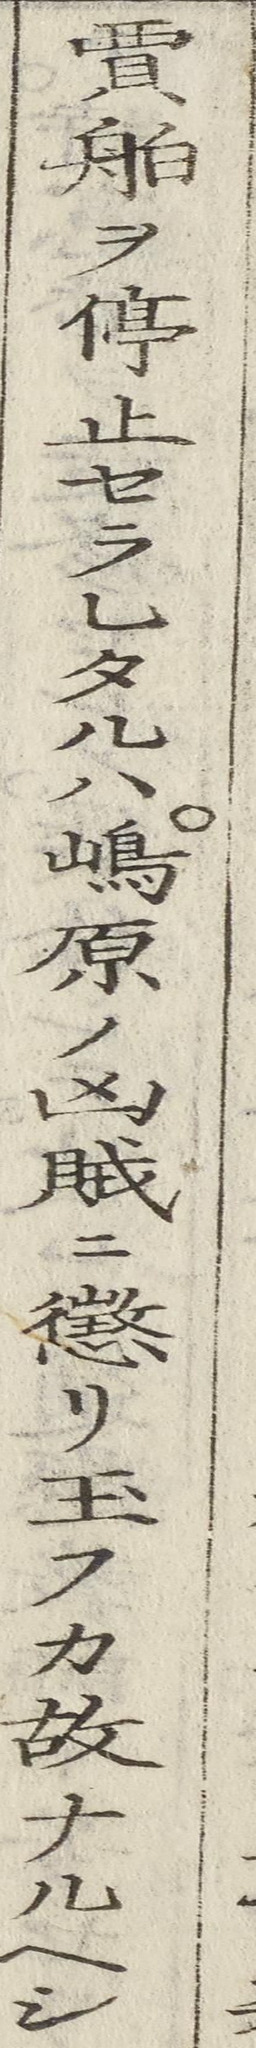商舶ヲ停止セラレタルハ。島原ノ凶賊ニ懲リ玉フカ故ナルヘシ
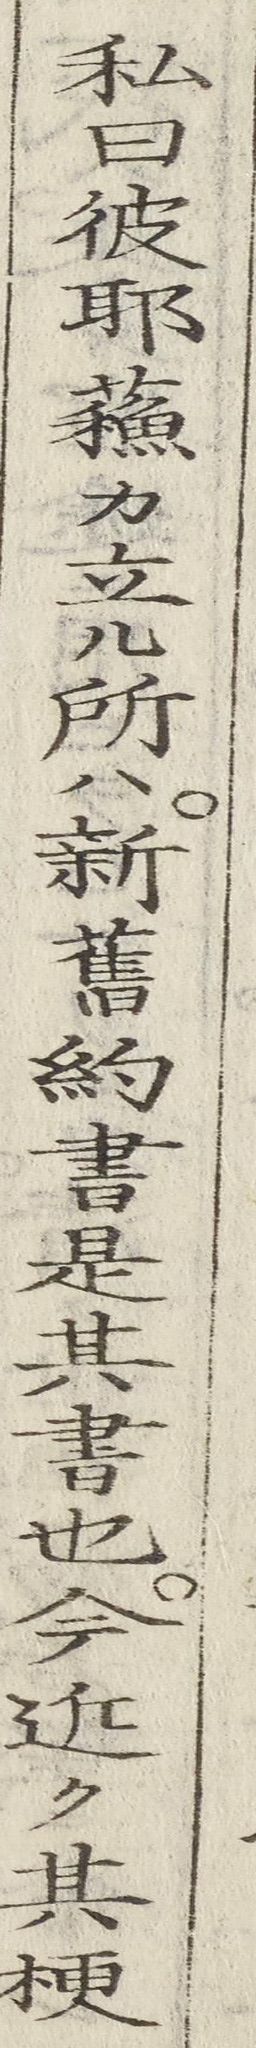私曰彼耶蘇カ立ル所ハ。新旧約書是其書也。今近ク其梗
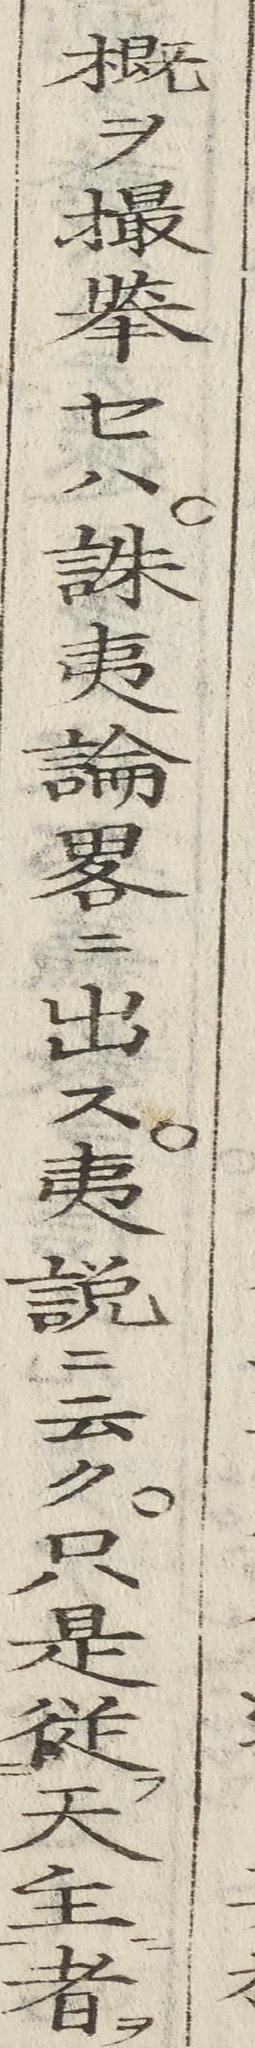概ヲ撮挙セハ。誅夷論略ニ出ス。夷説ニ云ク。只是従天主二者
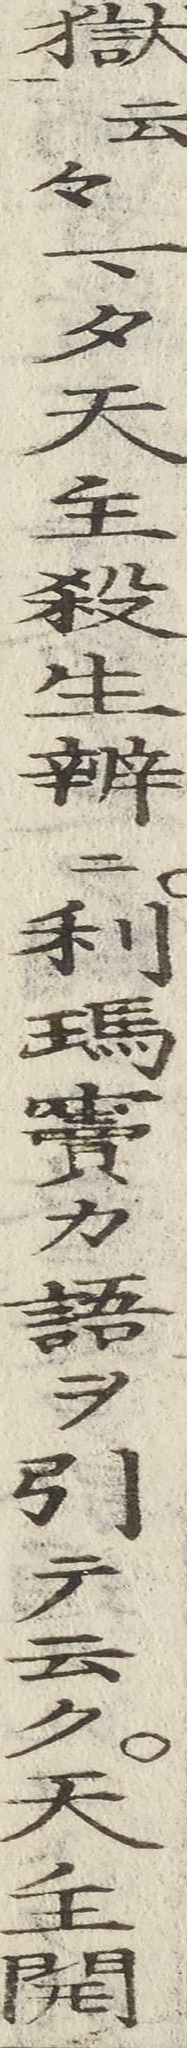獄。云々マタ天主殺生弁ニ。利瑪竇カ語ヲ引テ云ク。天主開
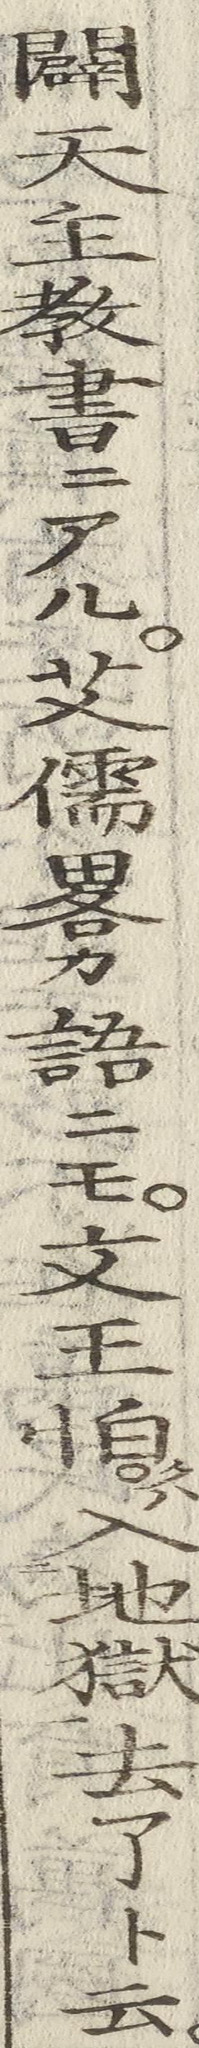闢天主教書ニアル。艾儒略カ語ニモ。文王伯。入地獄去了ト云。
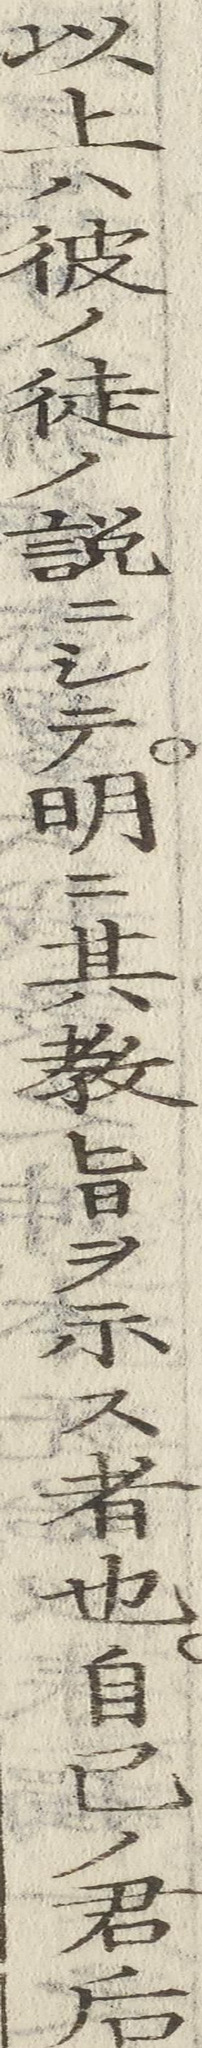以上ハ彼ノ徒ノ説ニシテ。明ニ其教旨ヲ示ス者也。自己ノ君后
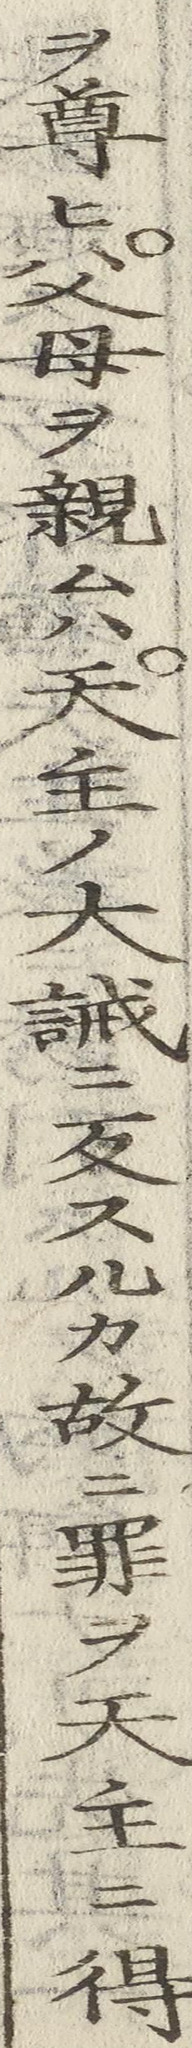ヲ尊ヒ。父母ヲ親ムハ。天主ノ大誡ニ反スルカ故ニ罪ヲ天主ニ得
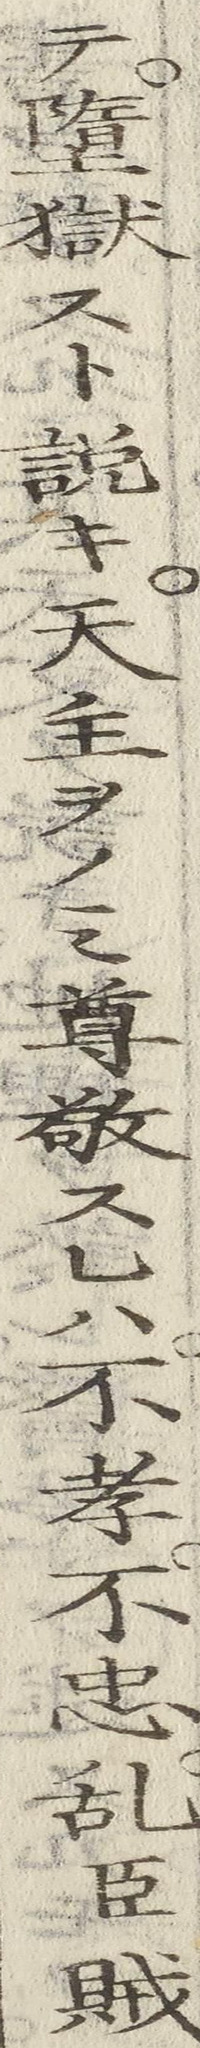テ。堕獄スト説キ。天主ヲノミ尊敬スレハ。不孝。不忠。乱臣賊
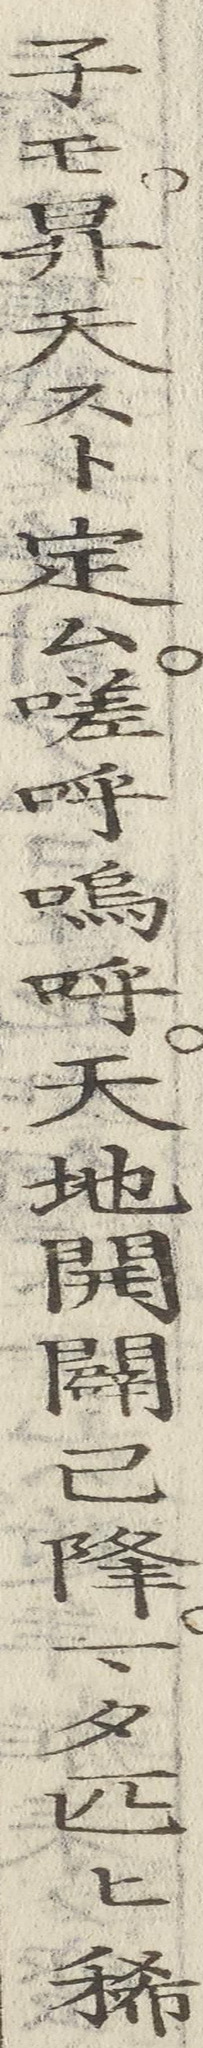子モ。昇天スト定ム。嗟呼嗚呼。天地開闢己降。マタ匹ヒ稀
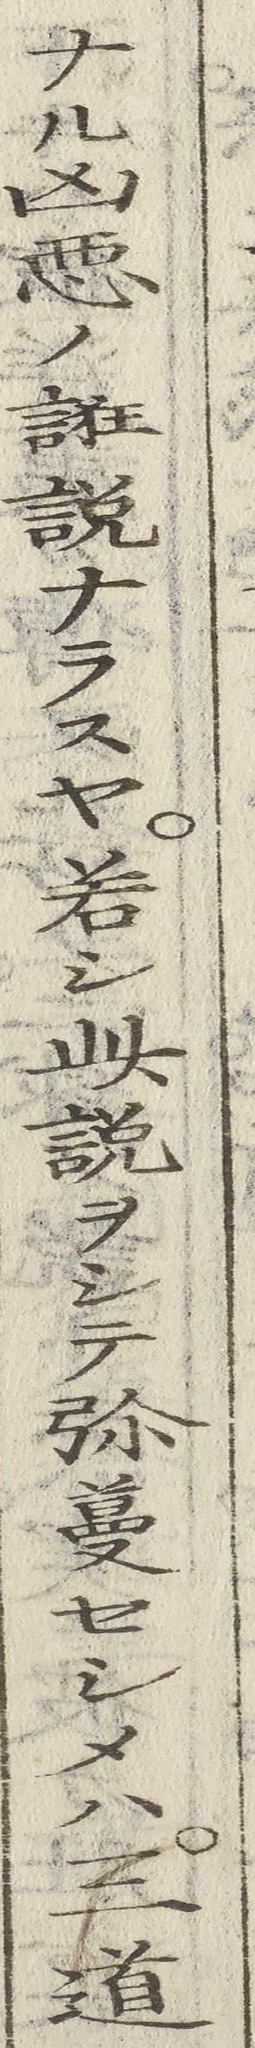ナル凶悪ノ誑説ナラスヤ。若シ此説ヲシテ弥蔓セシメハ。三道
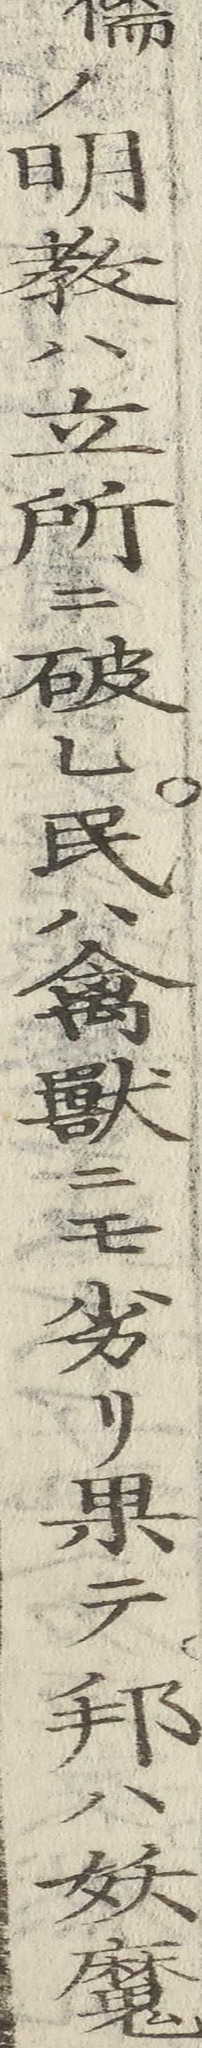神儒仏ノ明教ハ立所ニ破レ。民ハ禽獣ニモ劣リ果テ。邦ハ妖魔

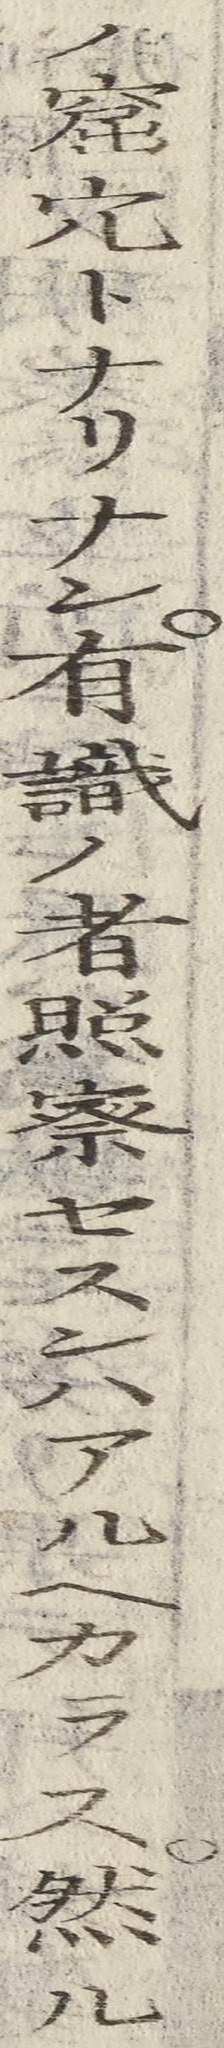ノ窟穴トナリナン。有識ノ者照察セスンハアルヘカラス。然ル
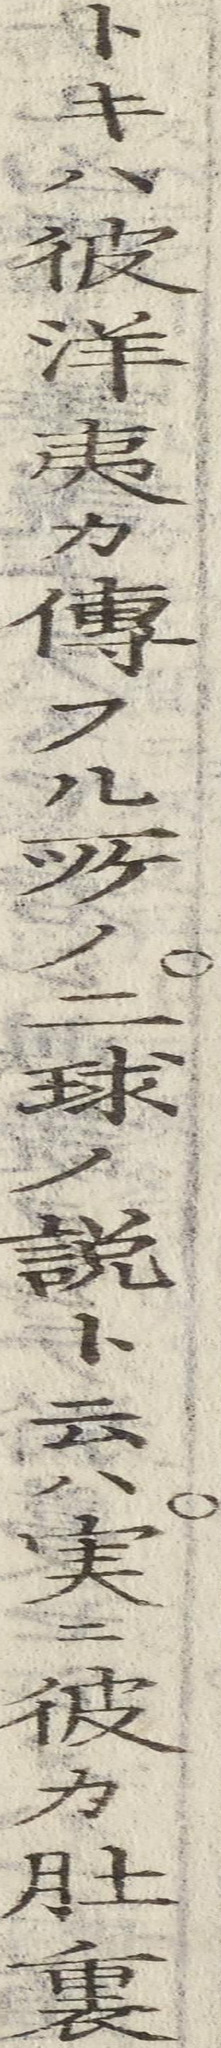トキハ彼洋夷カ伝フル所ノ。二球ノ説ト云ハ。実ニ彼カ肚裏
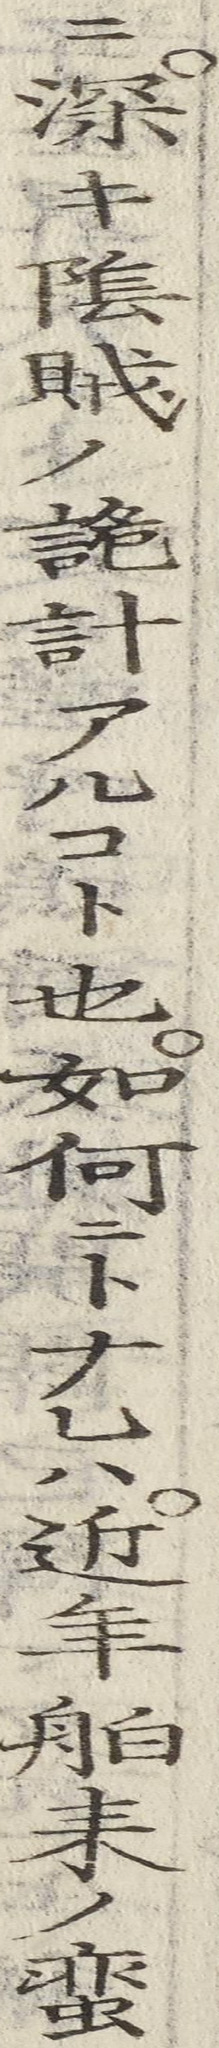ニ。深キ陰賊ノ詭計アルコト也。如何ニトナレハ。近年舶来ノ蛮
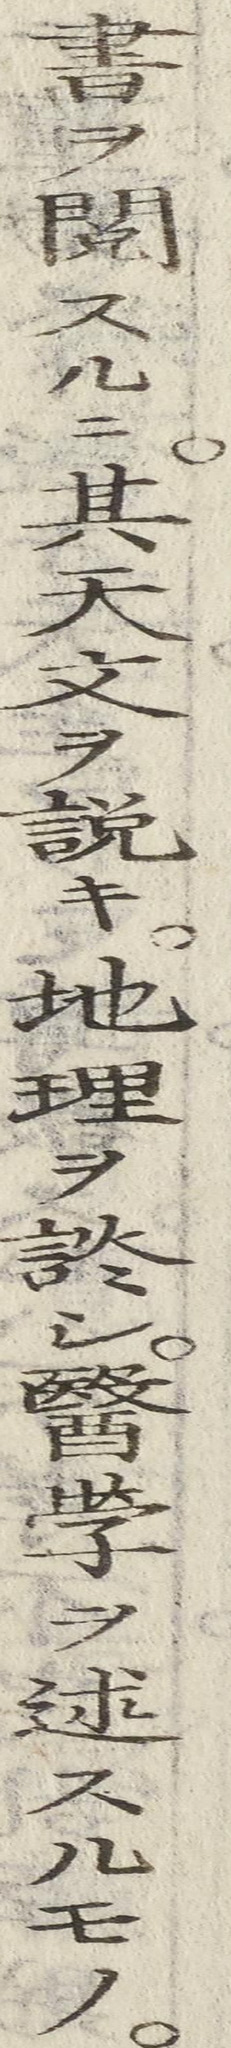書ヲ閲スルニ。其天文ヲ説キ。地理ヲ談シ。医学ヲ述スルモノ。
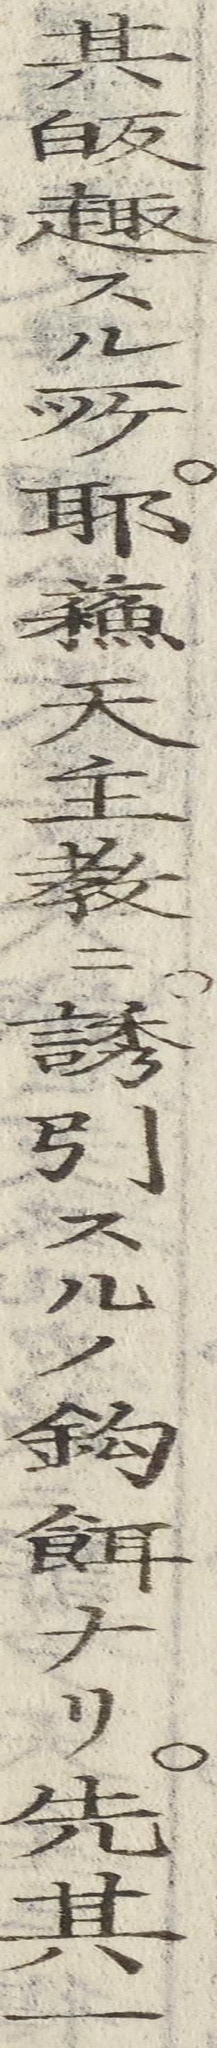其皈趣スル所。耶蘇天主教ニ誘引スルノ鈎餌ナリ。先其一
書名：護法新論　上
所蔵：東京大学地震研究所図書室 Earthquake Research Institute Library, The University of Tokyo, JAPAN
